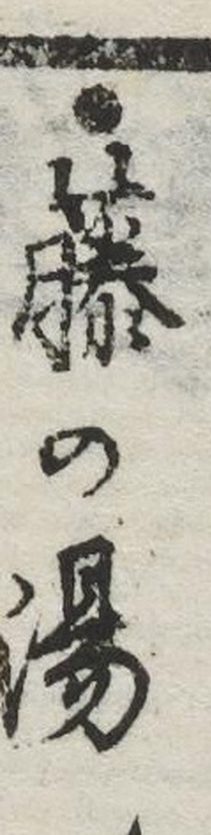●藤の湯
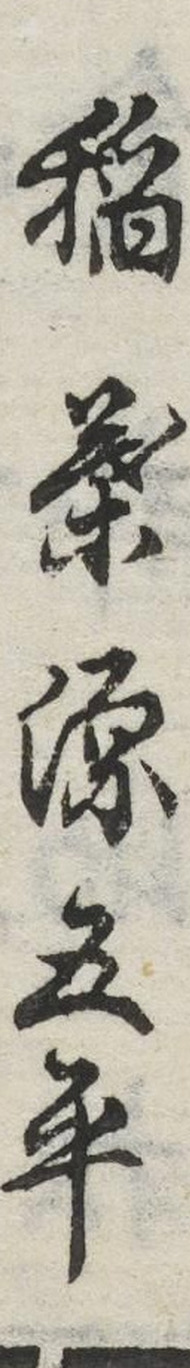稲葉源五平
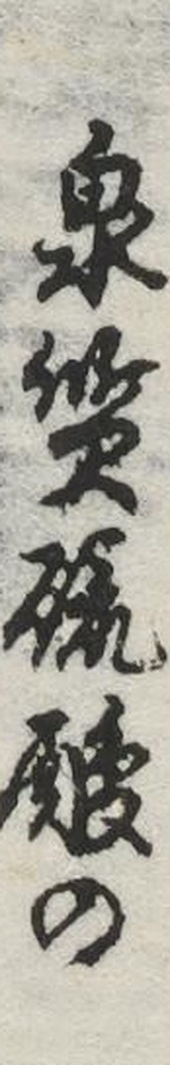泉質硫酸の
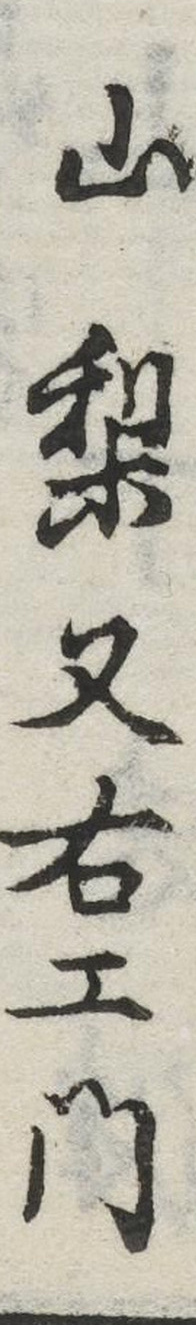山梨又右エ門
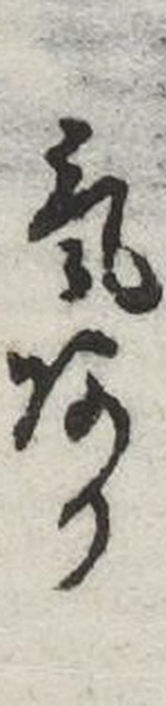気なり
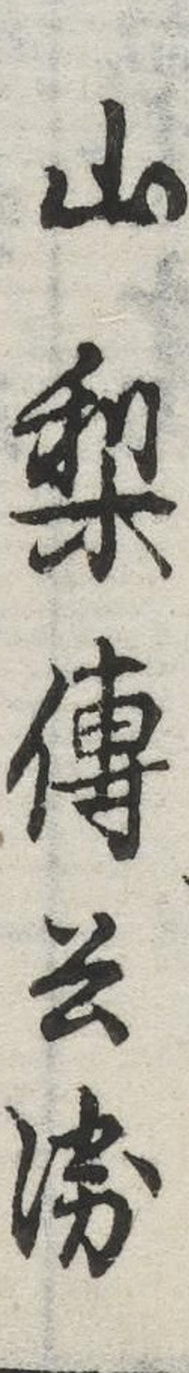山梨伝兵衛
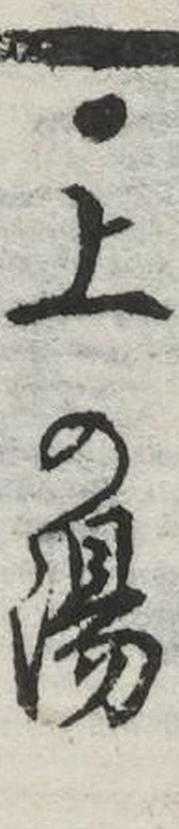●上の湯
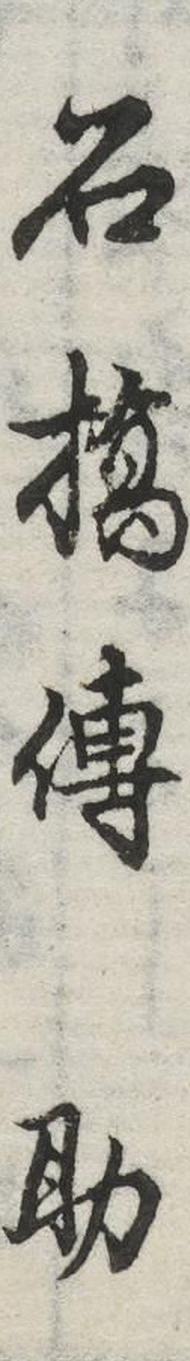石橋伝助
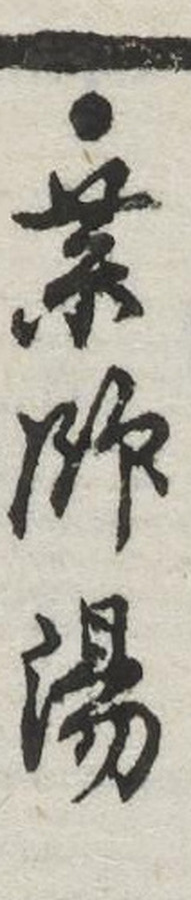●薬師湯
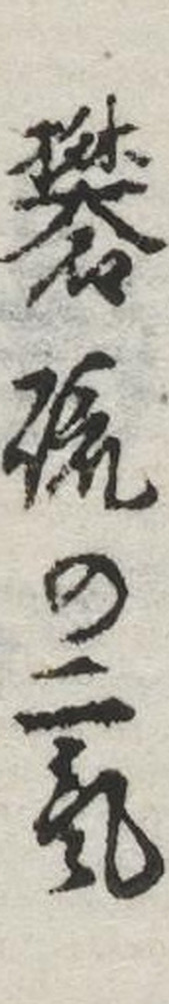礬硫の二気
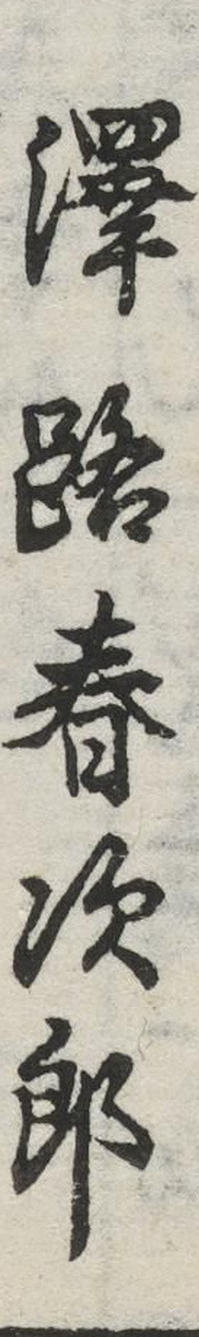澤路春次郎
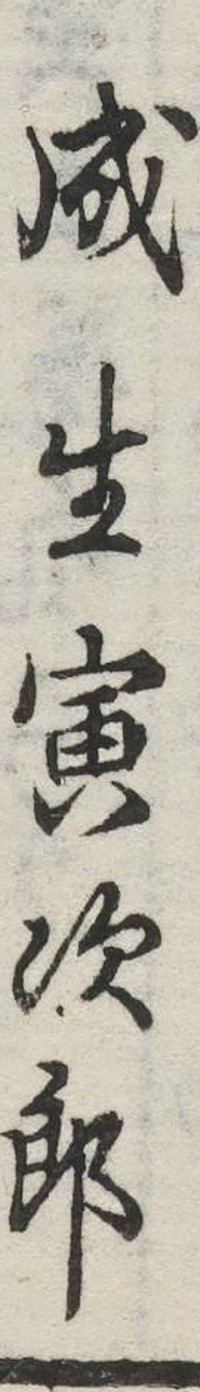成生寅次郎
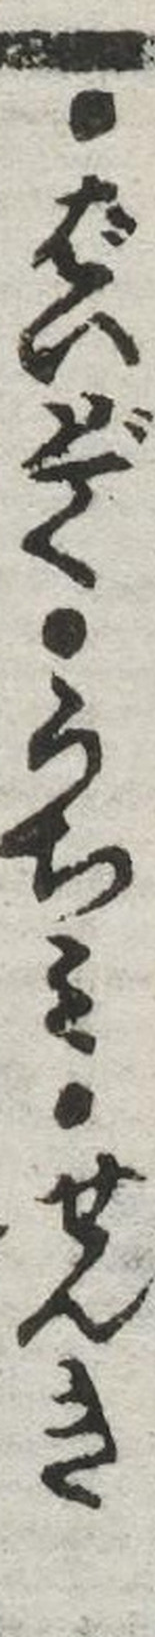●ばいどく●うちみ●せんき
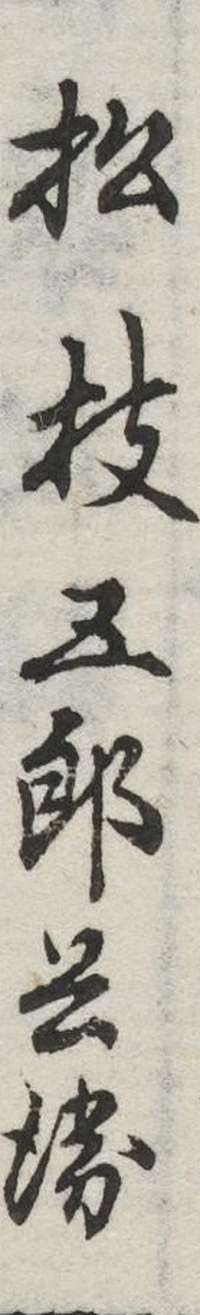松枝五郎兵衛
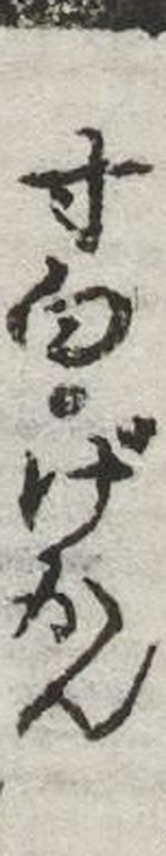寸白●げかん
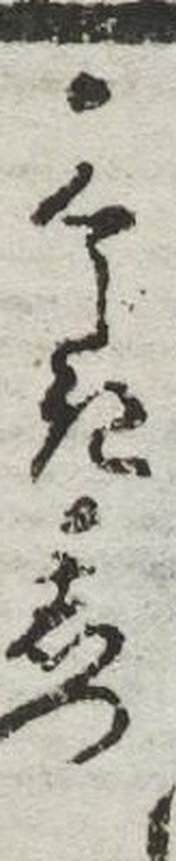●くじき●しつ
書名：諸國温泉遊覽記　全
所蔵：東京大学地震研究所図書室 Earthquake Research Institute Library, The University of Tokyo, JAPAN
